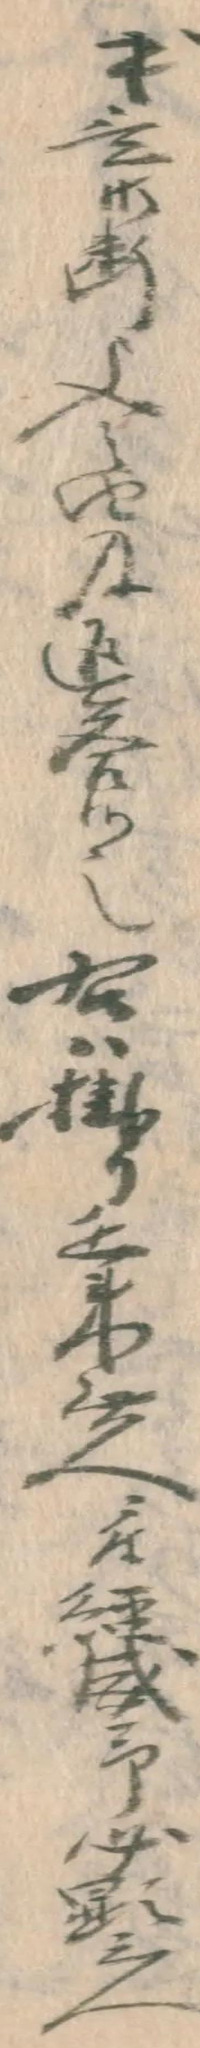本意御断申入之由及返答候也右ハ掛リ近来無人ニ付経威予必顕三人
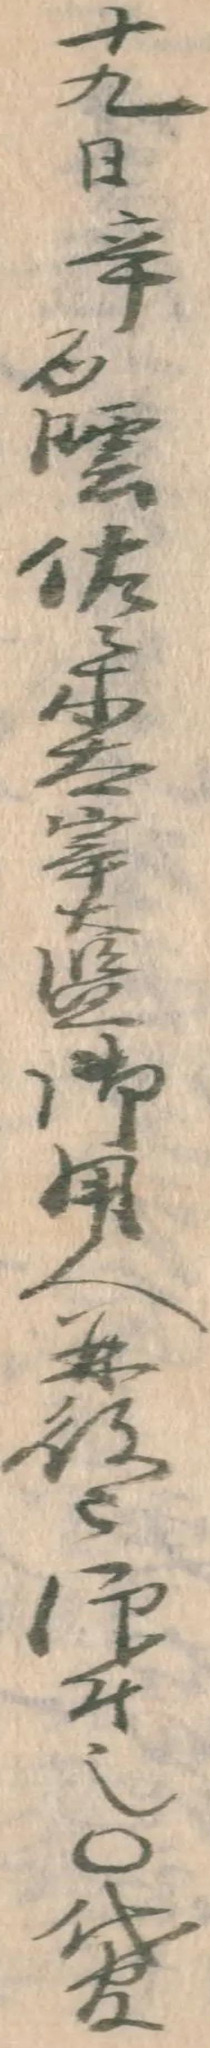十九日辛酉曇佐々木太宰大監御用人并役被仰付也○代官
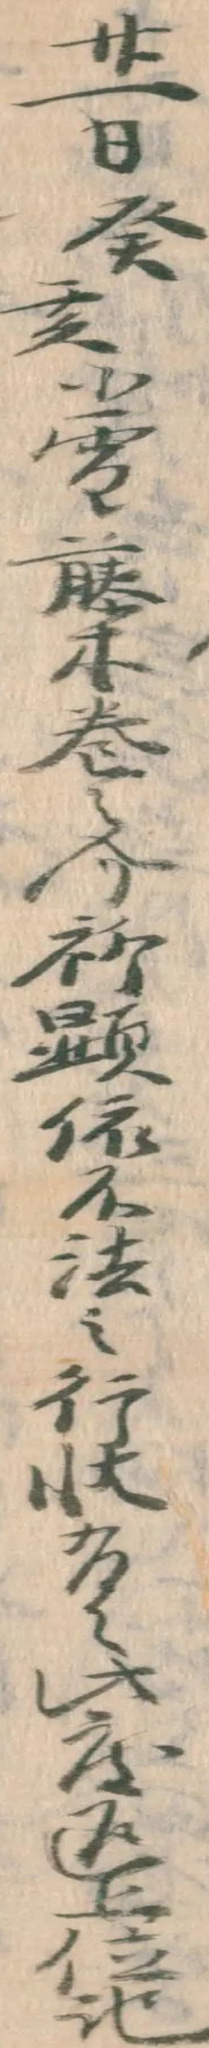廿一日癸亥小雪藤木巻之介祈顕依不法之行状有之此度返上位記
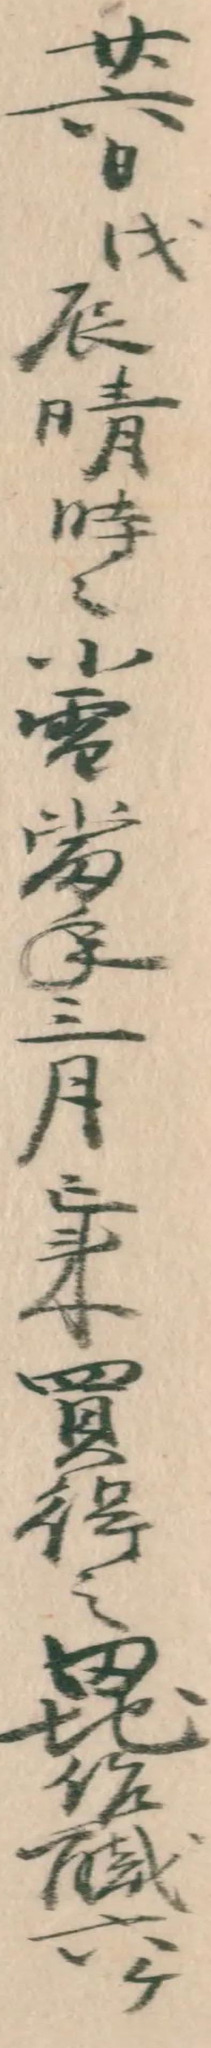廿六日戊辰晴時々小雪當年三月已来買得之田地作職六ケ
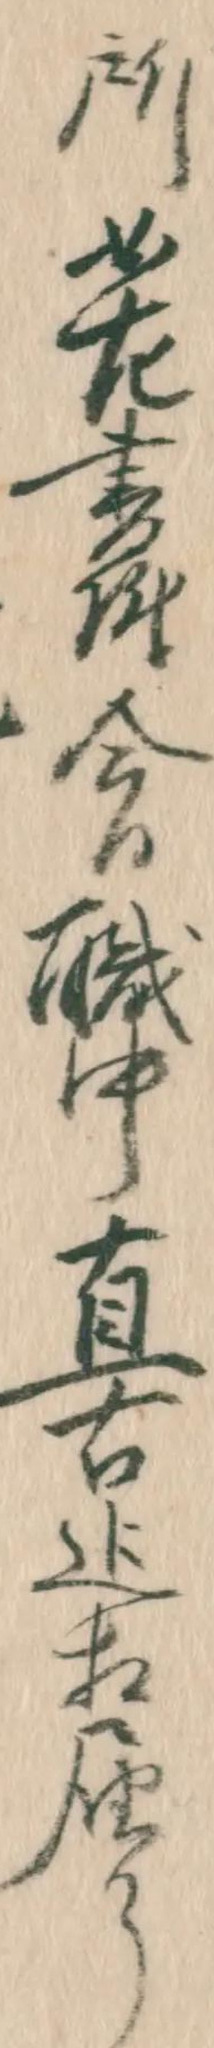所如左書附今日職中直古迄相届了
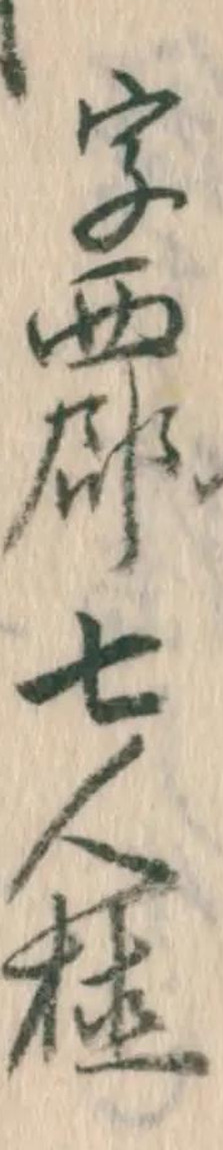字西郡七人植
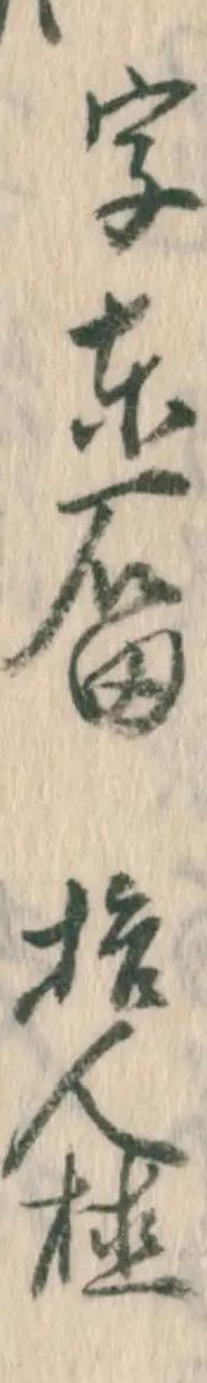字東石田拾人植
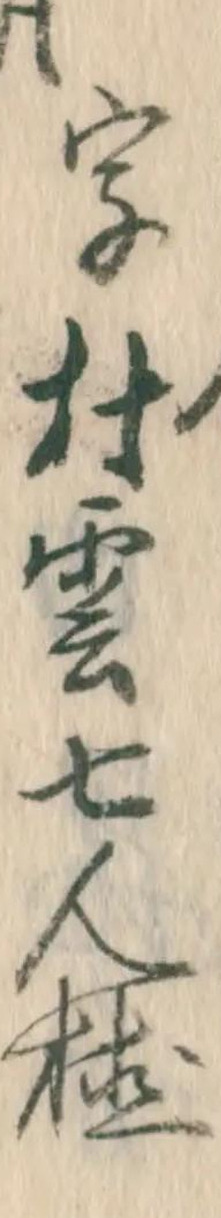字村雲七人植

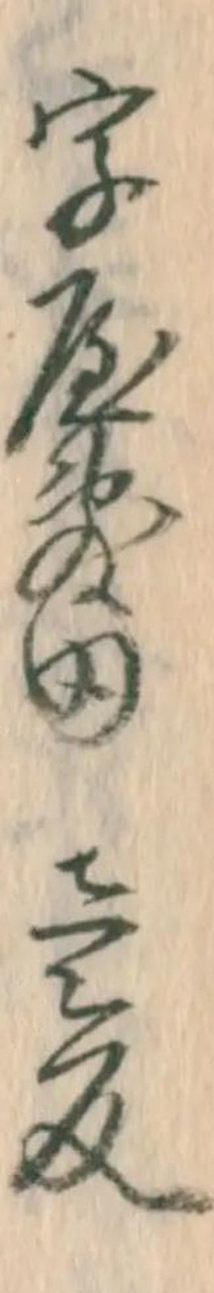字屋敷田壱反
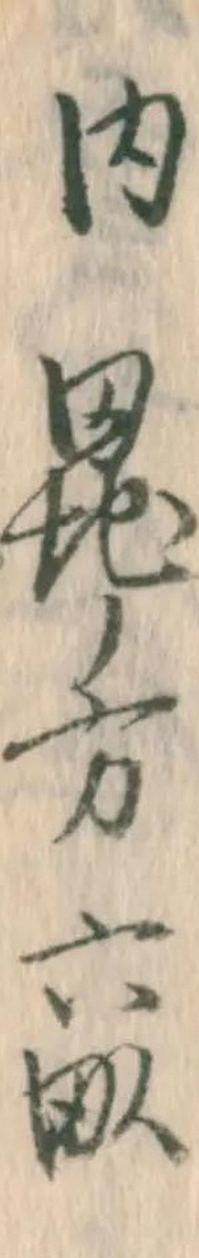内田地ノ方六畝
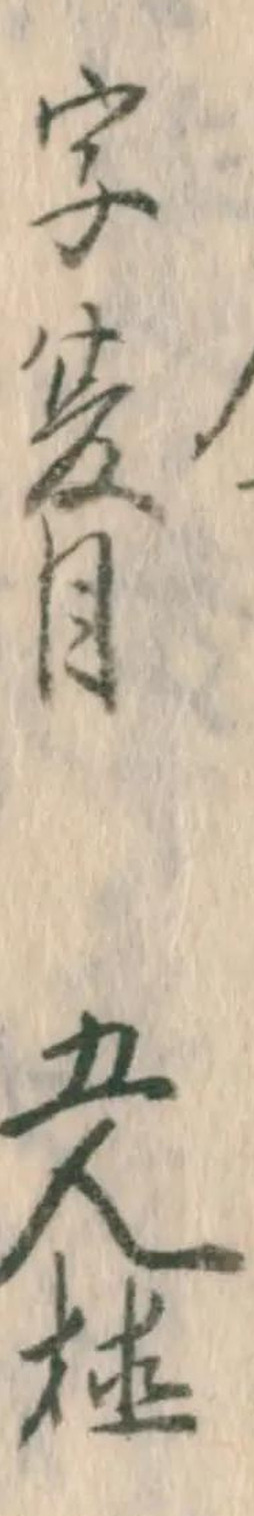字夏目五人植
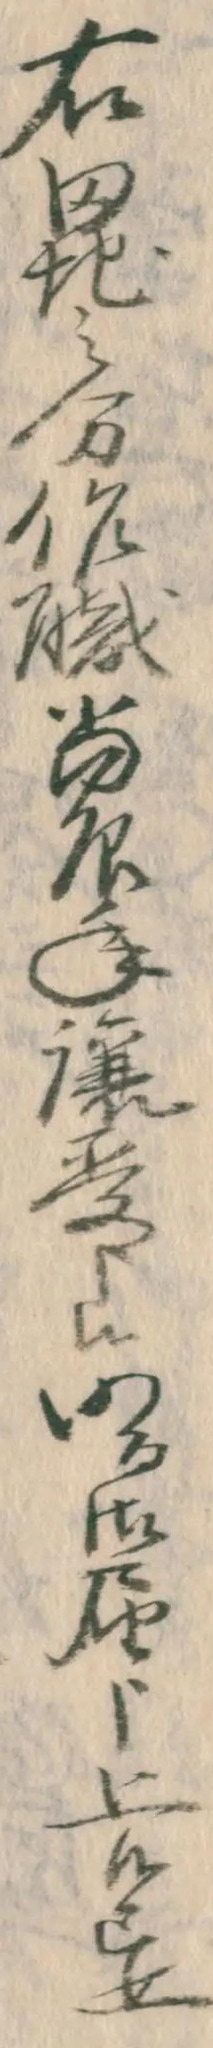右田地之分作職當辰年譲受申候仍而御届申上候已上
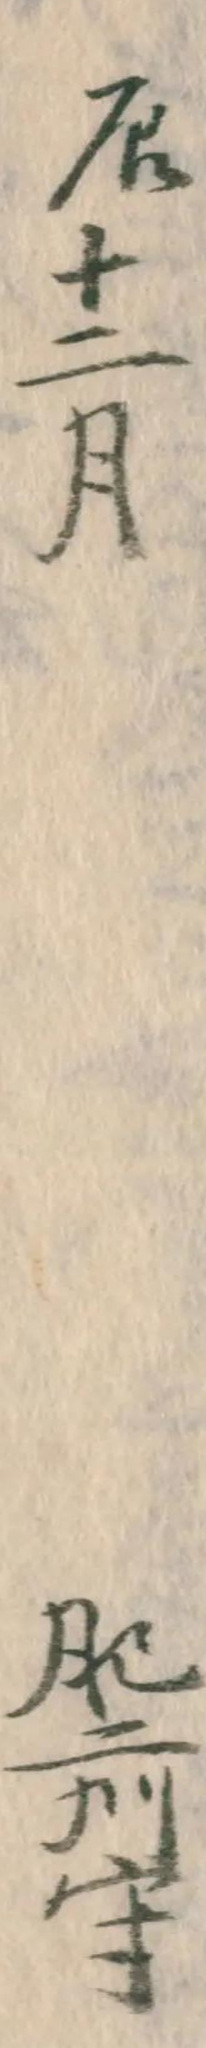辰十二月肥前守
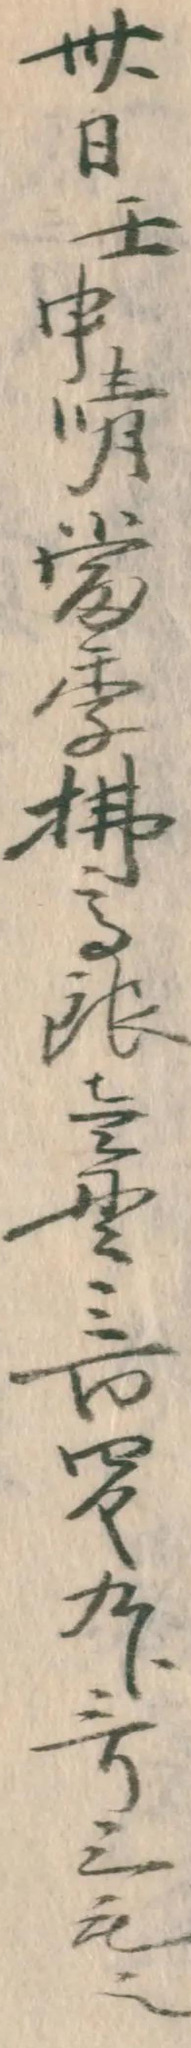卅日壬申晴當季払高銀壱貫三百四匁九分三り三毛也

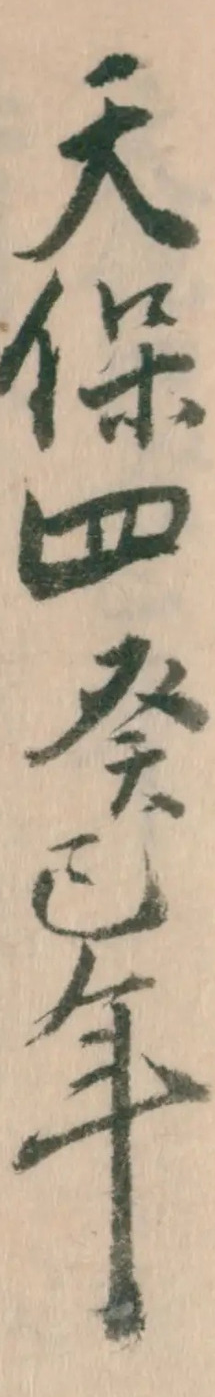天保四癸巳年
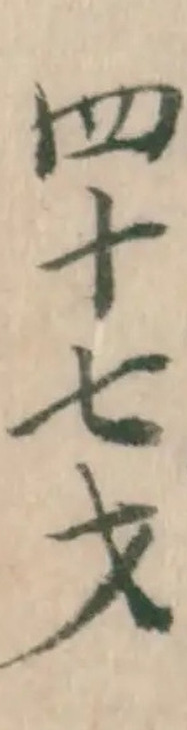四十七才
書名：賀茂社記録. 第66冊
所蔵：国立国会図書館 National Diet Library, JAPAN
